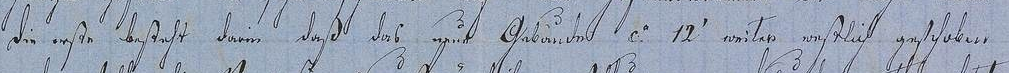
Die erste besteht darin daß das neue Gebäude ca 12' weiter westlich geschoben
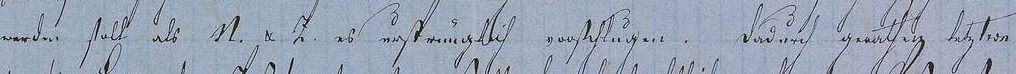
werden soll als N. & Z. es ursprünglich vorschlugen. Dadurch gerathen letztere
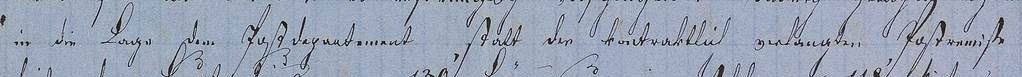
in die Lage dem Postdepartement statt der kontraktlich verlangten Postremise
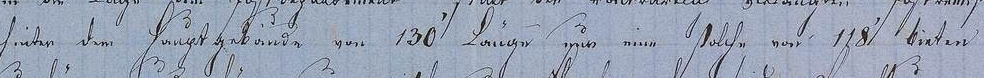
hinter dem Hauptgebäude von 130' Länge nur eine solche von 118' bieten
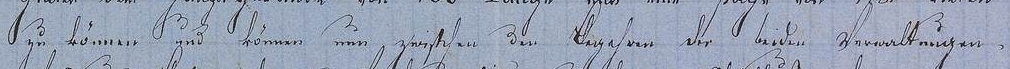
zu können und können nun zwischen den Begehren der beiden Verwaltungen,
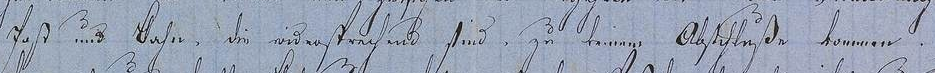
Post und Bahn, die widersprechend sind, zu keinem Abschluße kommen.
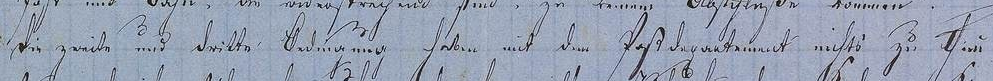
Die zweite und dritte Bedingung haben mit dem Postdepartement nichts zu thun
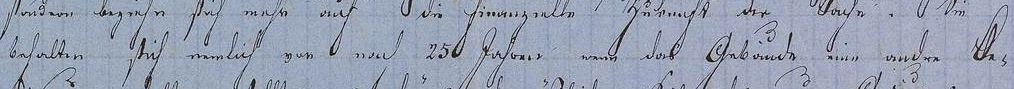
behalten sich nemlich vor nach 25 Jahren wenn das Gebäude eine andre Be-
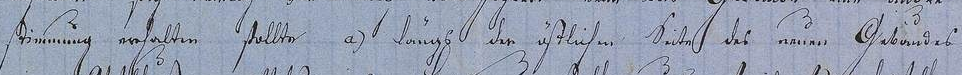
stimmung erhalten sollte a) längs der östlichen Seite des neuen Gebäudes
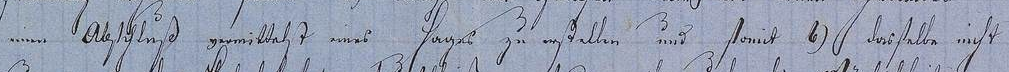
einen Abschluß vermittelst eines Hages zu erstellen und somit b) dasselbe nicht
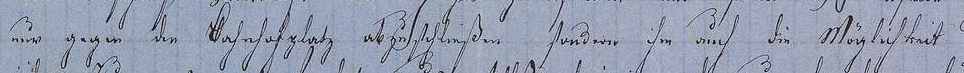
nur gegen den Bahnhofplatz abzuschließen sondern ihm auch die Möglichkeit
